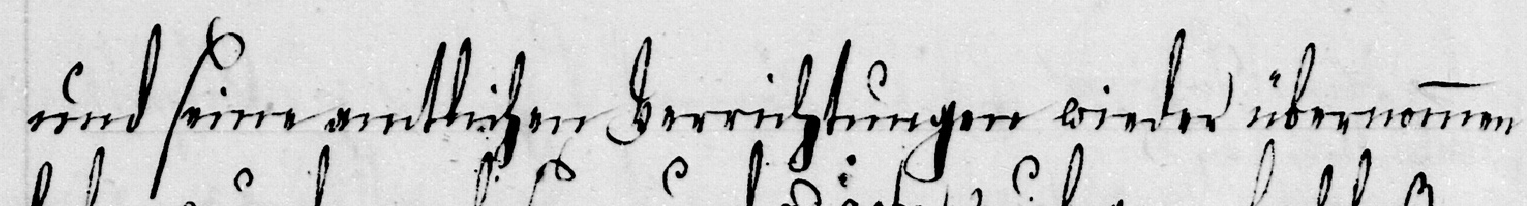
und seine amtlichen Verrichtungen wieder übernommen
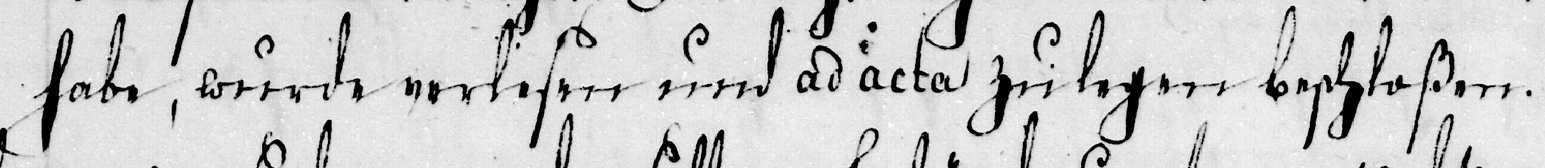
habe, wurde verlesen und ad acta zu legen beschloßen.
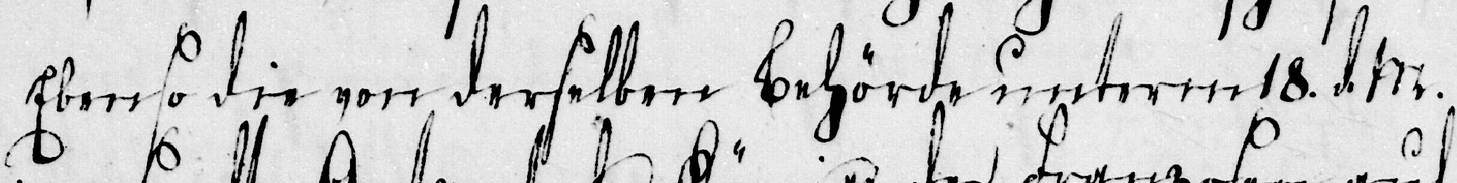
Ebenso die von derselben Behörde unterm 18. d. M.
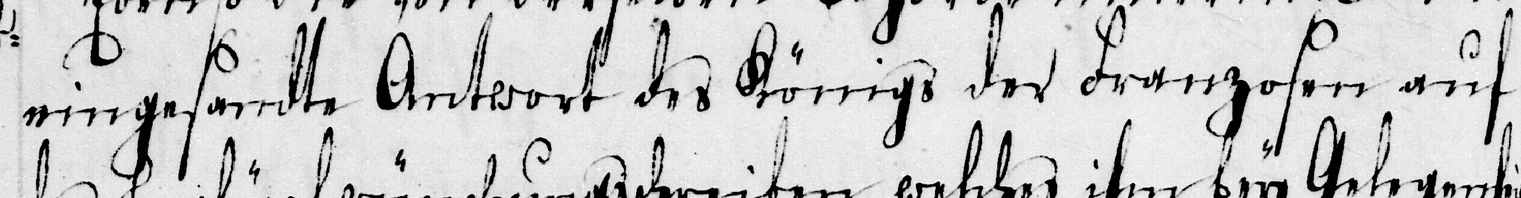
eingesandte Antwort des Königs der Franzosen auf
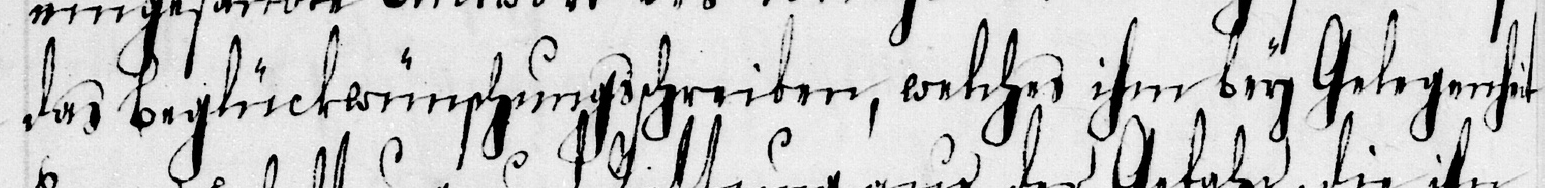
das Beglückwünschungsschreiben, welches ihm bey Gelegenh¬
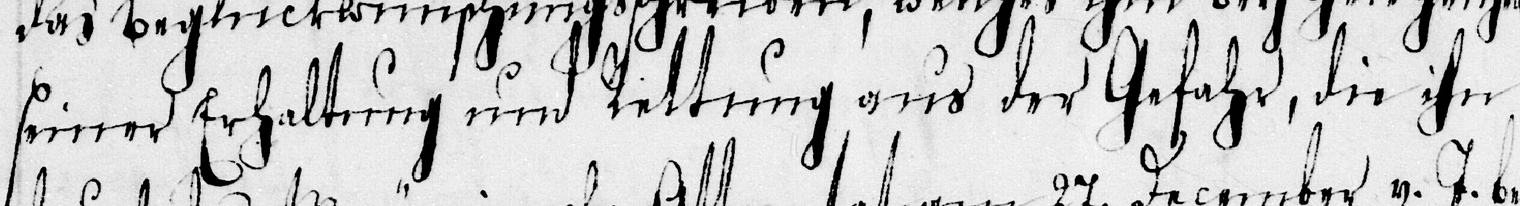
seiner Erhaltung und Rettung aus der Gefahr, die ihn
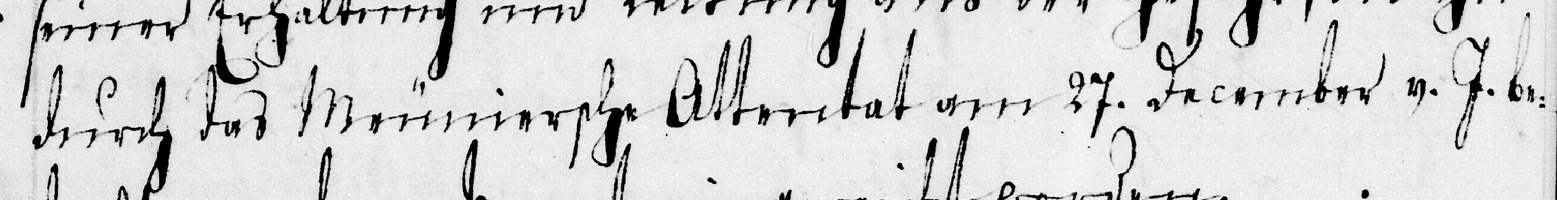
durch das Meuniersche Attentat vom 27. December v. J. b¬
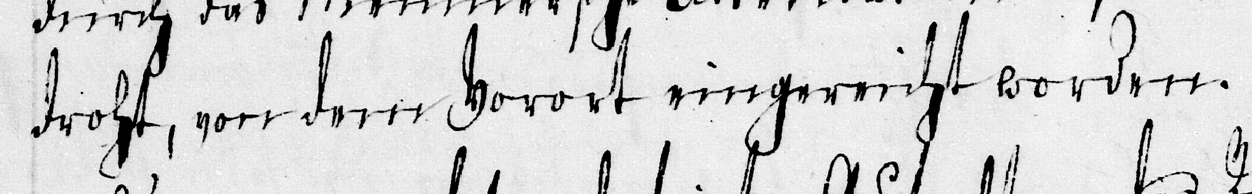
edroht, von dem Vorort eingereicht worden.
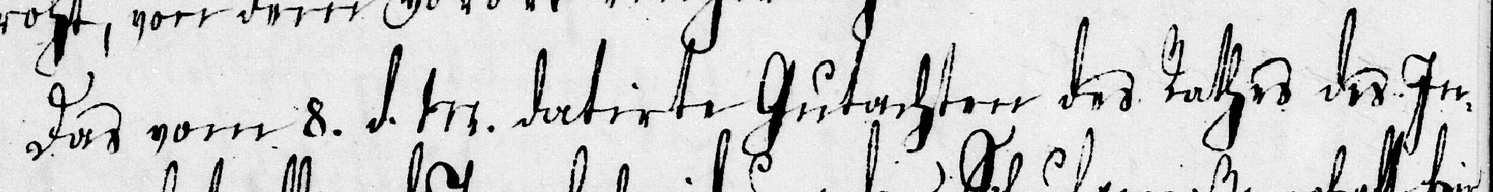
Das vom 8. d. M. datirte Gutachten des Rathes des In¬
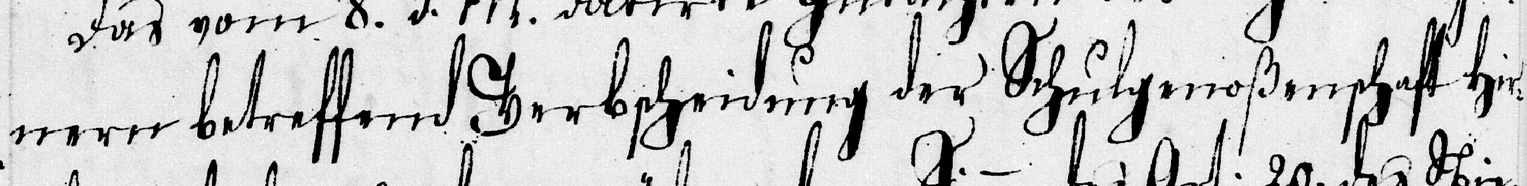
nern betreffend Verbscheidung der Schulgenoßenschaft H¬
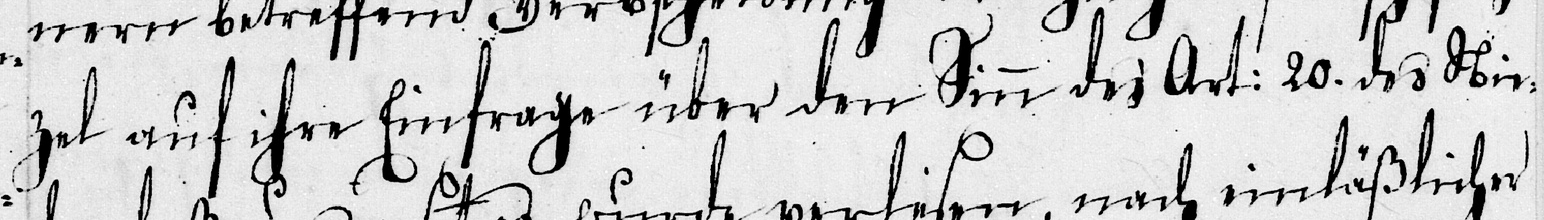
zel auf ihre Einfrage über den Sinn des Art: 20. des Nie¬
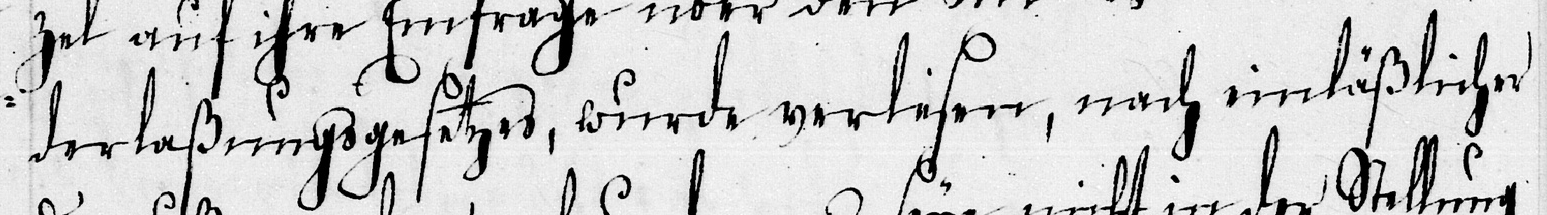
derlaßungsgesetzes, wurde verlesen, nach einläßlicher
